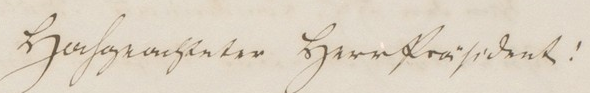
Hochgeachteter Herr Präsident!
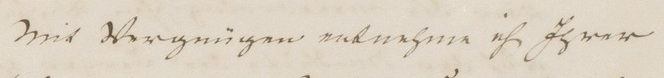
Mit Vergnügen entnehme ich Ihrer
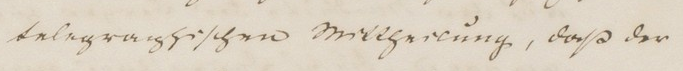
telegraphischen Mittheilung, daß der
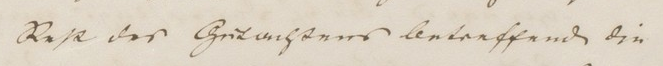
Rest des Gutachtens betreffend die
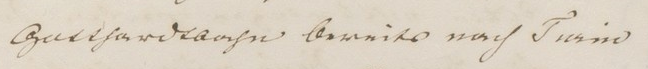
Gotthardtbahn bereits nach Turin
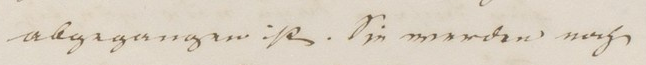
abgegangen ist. Sie werden noch
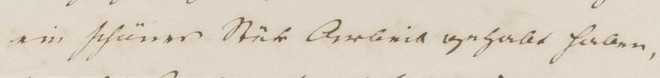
ein schönes Stük Arbeit gehabt haben,
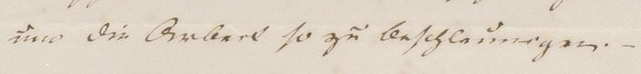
um die Arbeit so zu beschleunigen. –
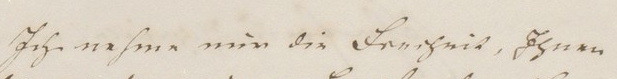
Ich nehme mir die Freiheit, Ihnen
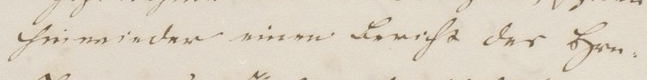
hinwieder einen Bericht des Hrn.
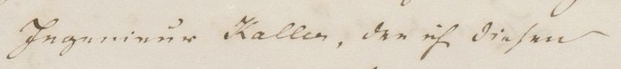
Ingenieur Koller, den ich diesen
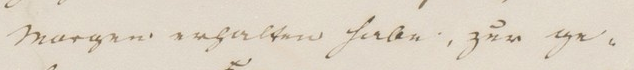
Morgen erhalten habe, zur ge-
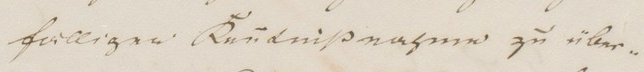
fälligen Kenntnißnahme zu über-
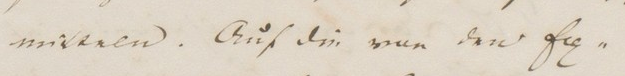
mitteln. Auf die von den Ex-
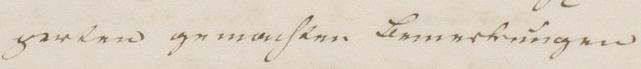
perten gemachten Bemerkungen
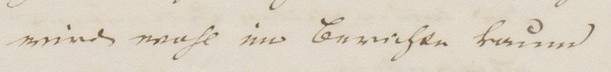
wird wohl im Berichte kaum
